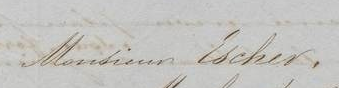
Monsieur Escher,
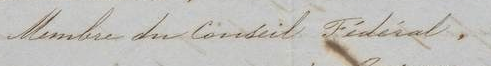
Membre du Conseil Fédéral,
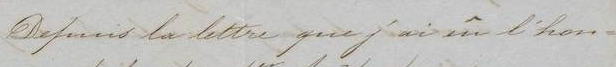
Depuis la lettre que j'ai eû l'hon-
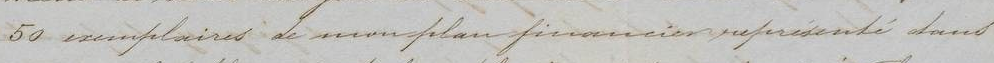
50 exemplaires de mon plan financier représenté dans
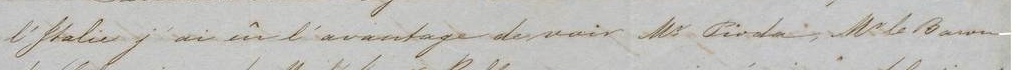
l'Italie j'ai eû l'avantage de voir MrPioda, Mr le Baron
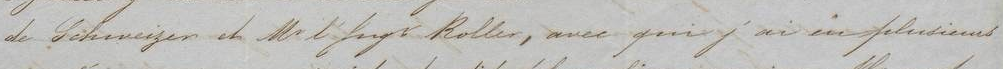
de Schweizer et Mr l'IngrKoller, avec qui j'ai eû plusieurs
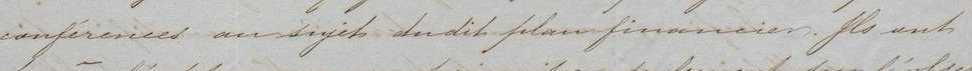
conférences au sujet du dit plan financier. Ils ont
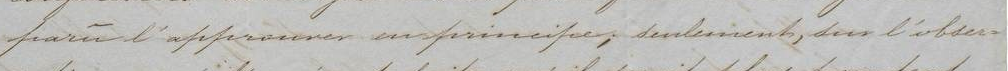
parû l'approuver en principe; seulement, sur l'obser-
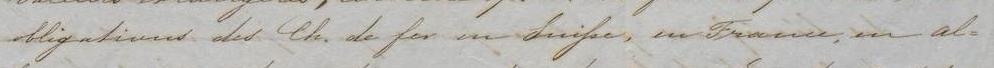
obligations des Ch. de fer en Suisse, en France, en Al-
